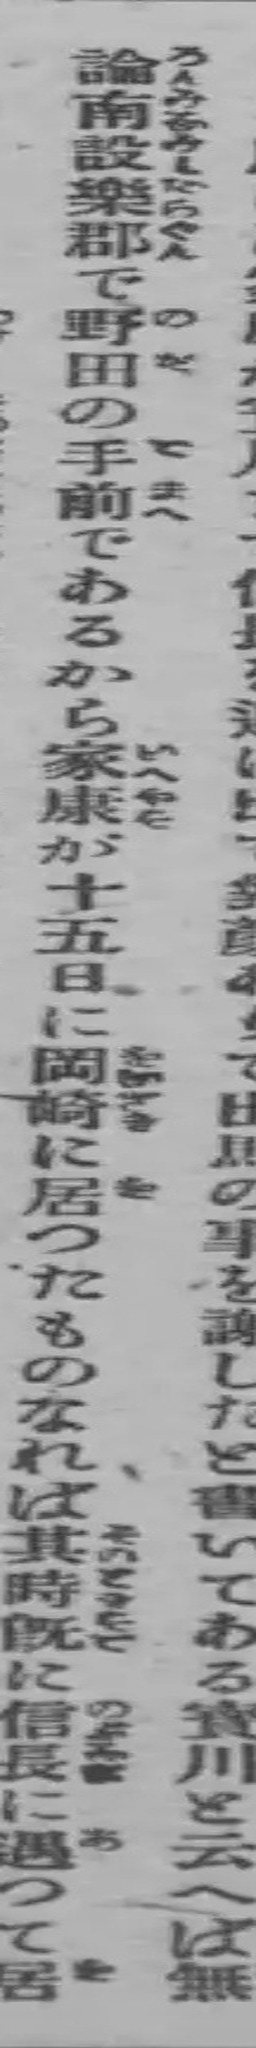論南設楽郡で野田の手前であるから家康が十五日に岡崎に居つたものなれば其時既に信長に遭つて居
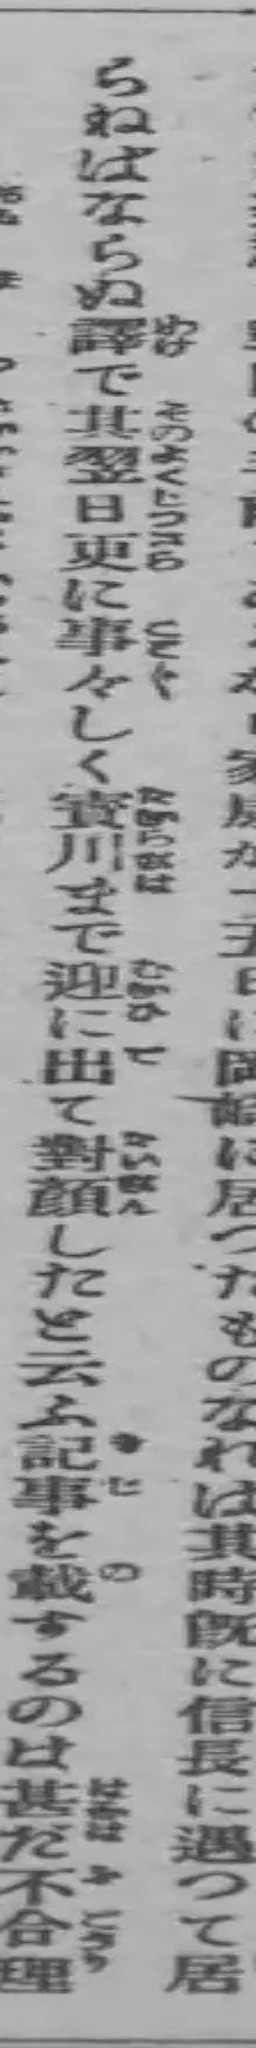らねばならぬ訳で其翌日更に事々しく宝川まで迎に出て対顔したと云ふ記事を載するのは甚だ不合理
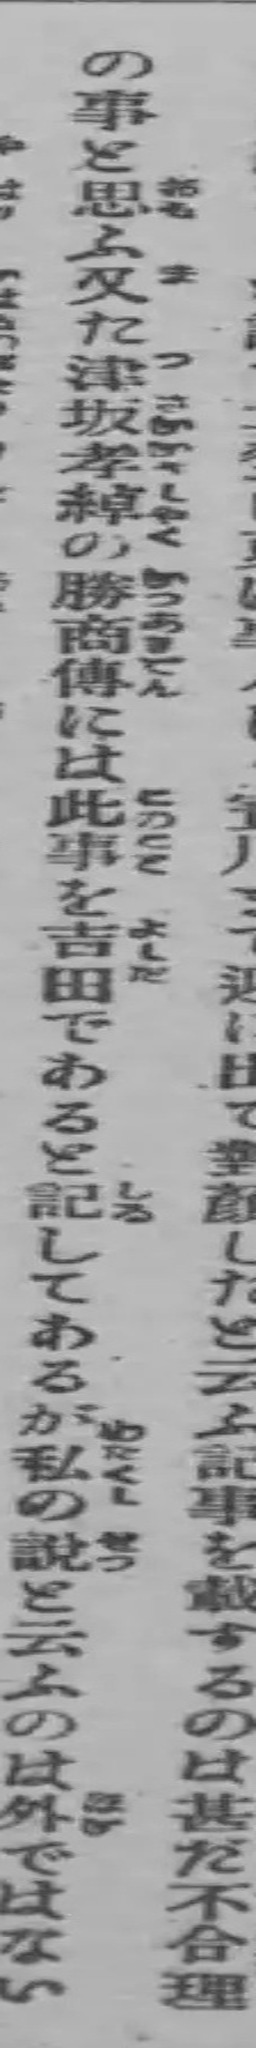の事と思ふ又た津坂孝綽の勝商伝には此事を吉田であると記してあるが私の説と云ふのは外ではない
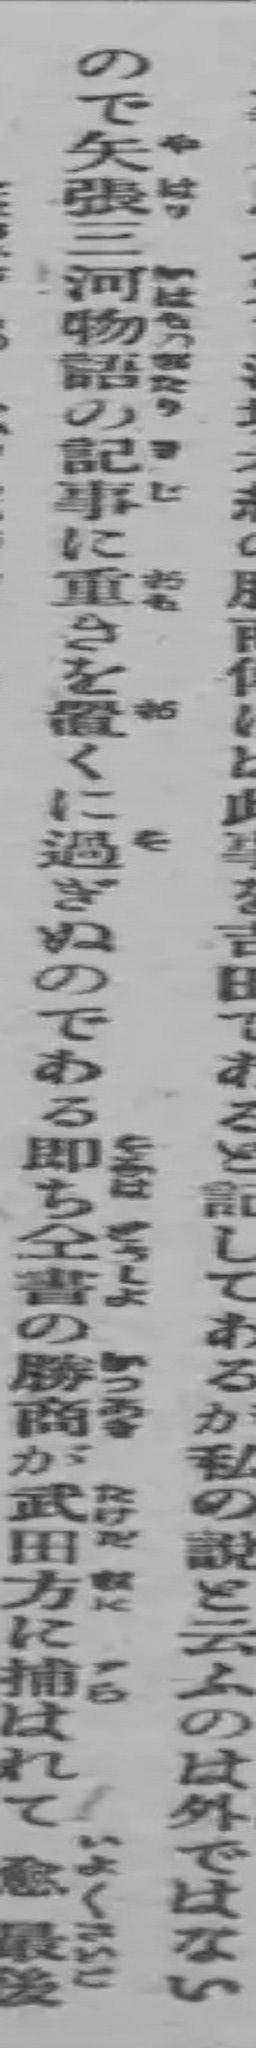ので矢張三河物語の記事に重きを置くに過ぎぬのである即ち仝書の勝商が武田方に捕はれて愈最後
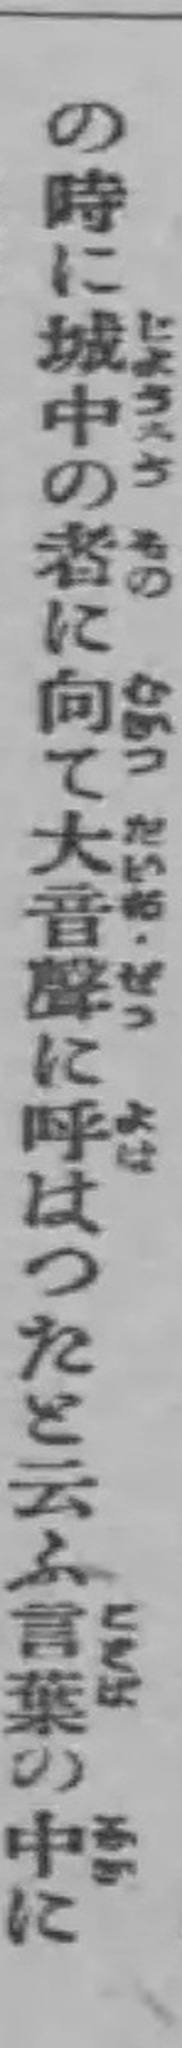の時に城中の者に向て大音声に呼はつたと云ふ言葉の中に
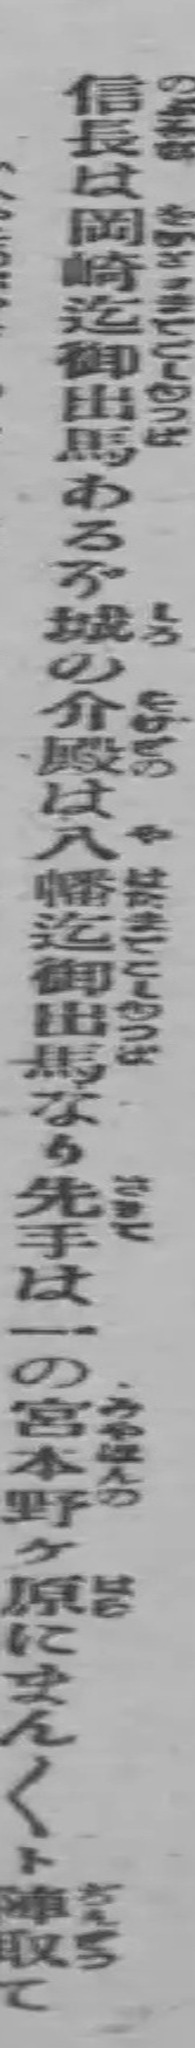信長は岡崎迄御出馬あるぞ城の介殿は八幡迄御出馬なり先手は一の宮本野ケ原にまん〳〵ト陣取て
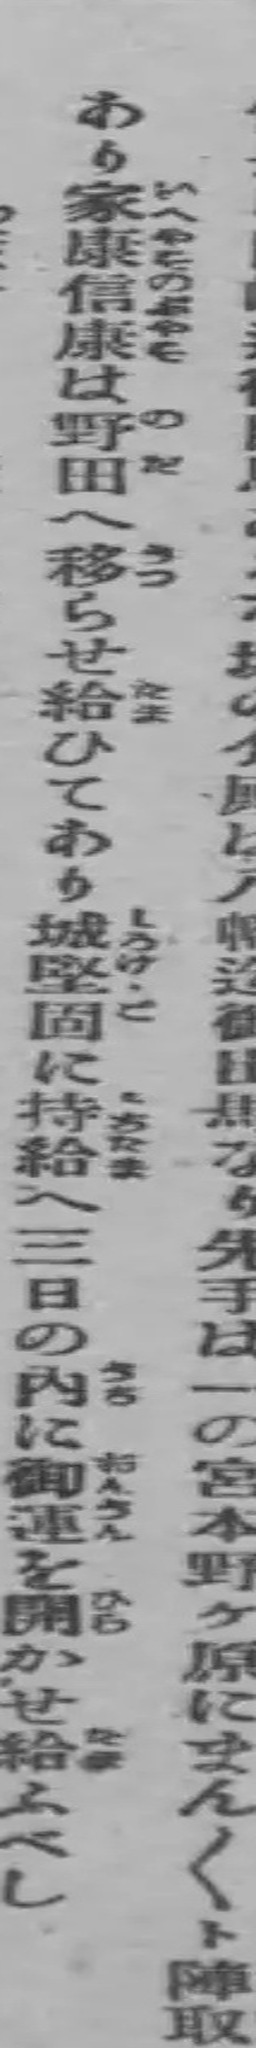あり家康信康は野田へ移らせ給ひてあり城堅固に持給へ三日の内に御運を開かせ給ふべし
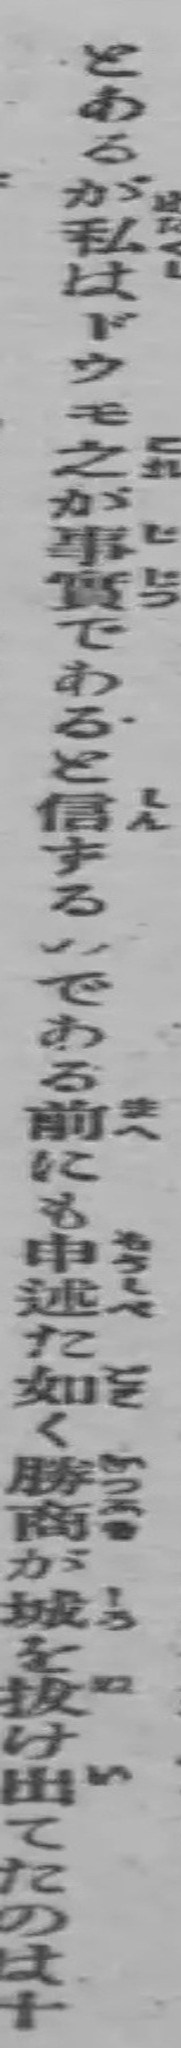とあるが私はドウモ之が事実であると信ずるのである前にも申述た如く勝商が城抜け出てたのは十
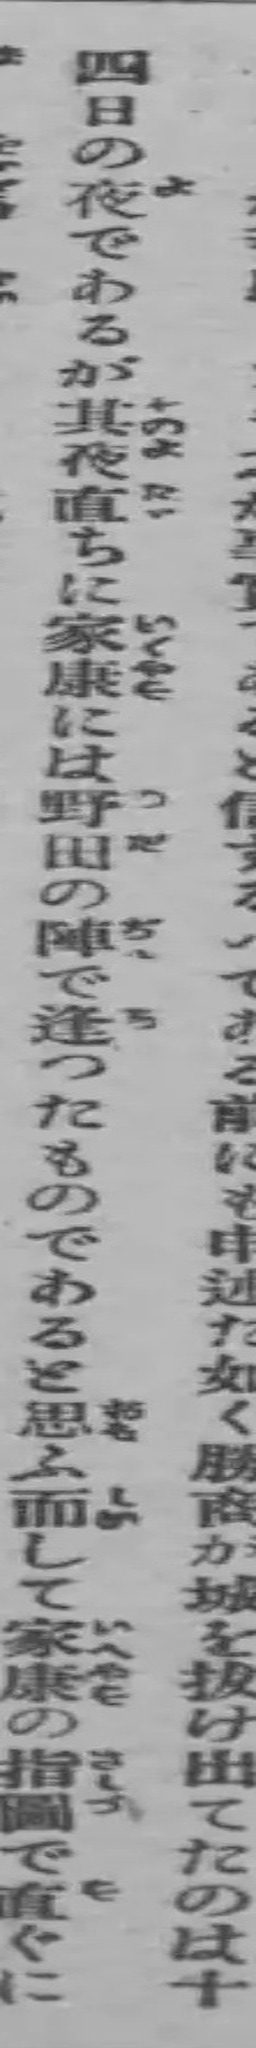四日の夜であるが其夜直ちに家康には野田の陣で逢つたものであると思ふ而して家康の指図で直ぐに
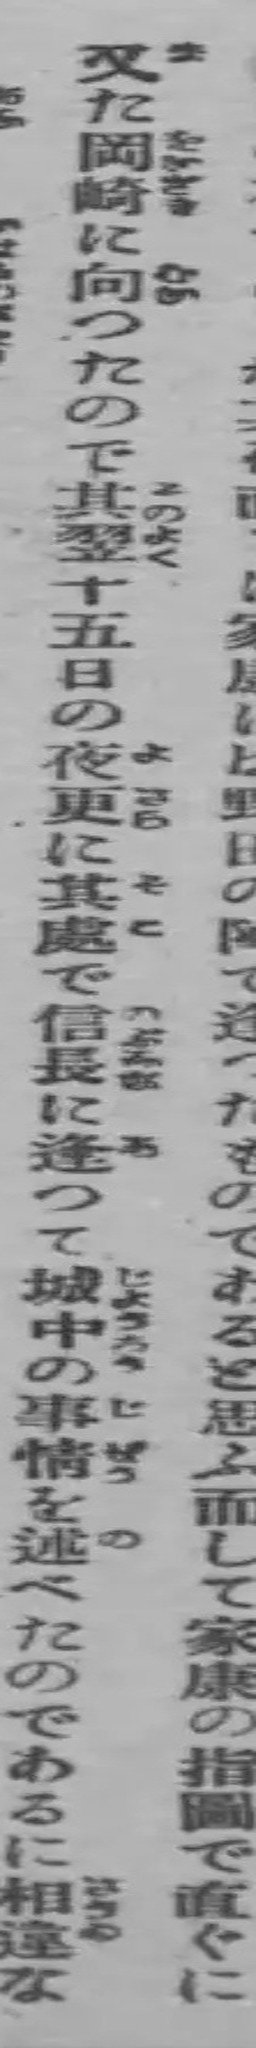又た岡崎に向つたので其翌十五日の夜更に其処で信長に逢つて城中の事情を述べたのであるに相違な
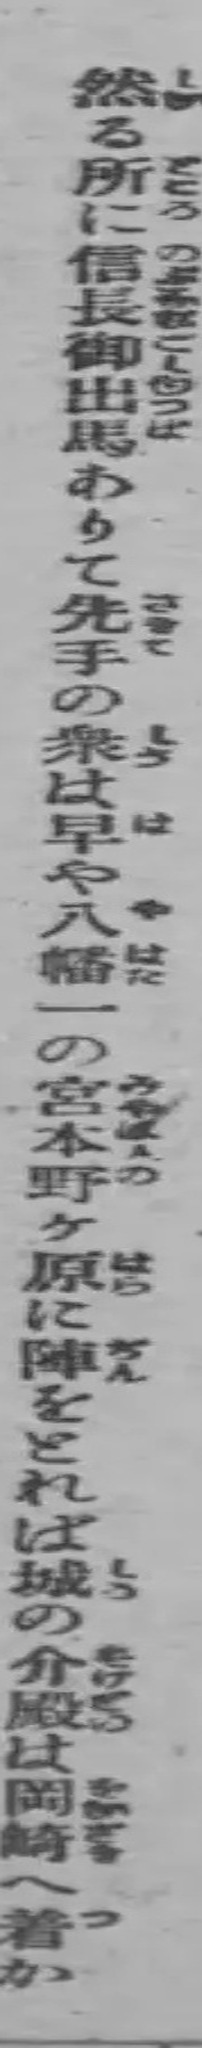然る所信長御出馬ありて先手の衆は早や八幡一の宮本野ケ原に陣をとれば城の介殿は岡崎へ着か
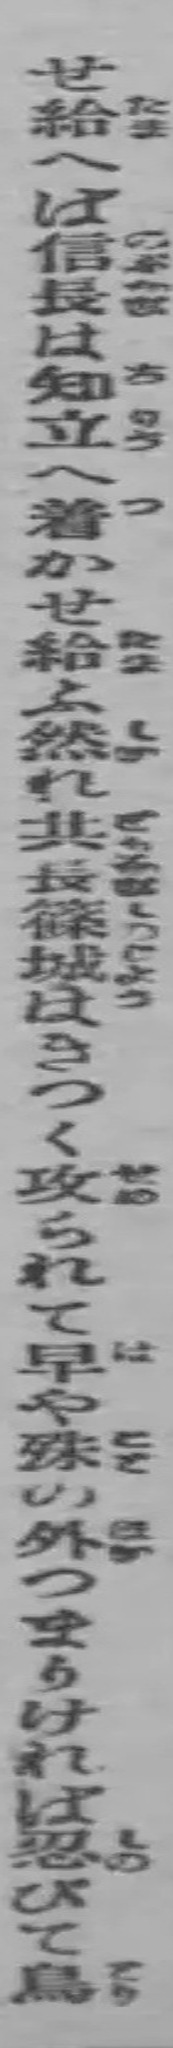せ給へば信長は知立へ着かせ給ふ然れ共長篠城はきつく攻られ早や殊の外つまりければ忍びて鳥
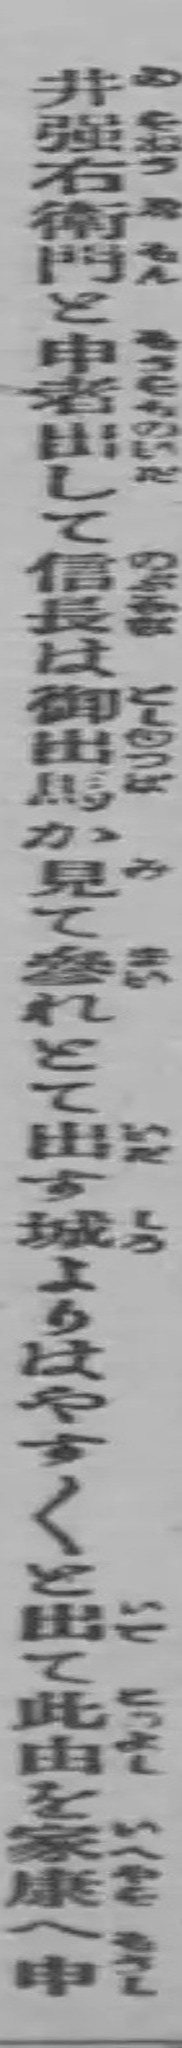居強右衛門と申者出して信長は御出馬か見て参れとて出す城よりはやす〳〵と出て此由を家康へ申
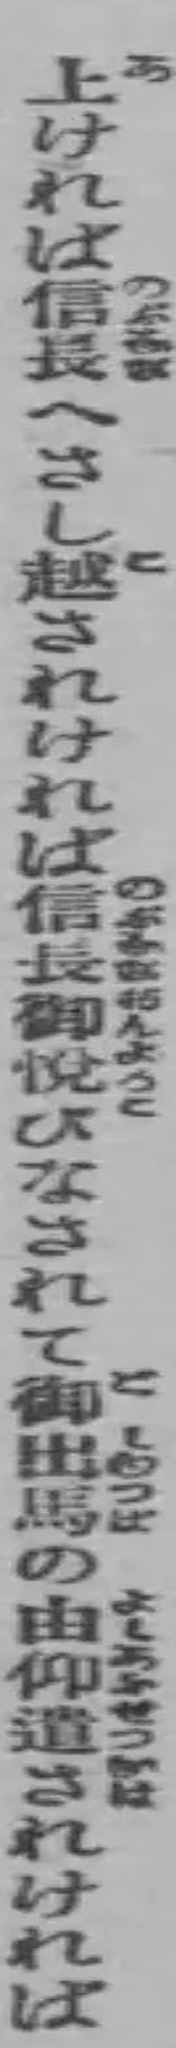上ければ信長へさし越されければ信長御悦びなされて御出馬の由仰遣されければ
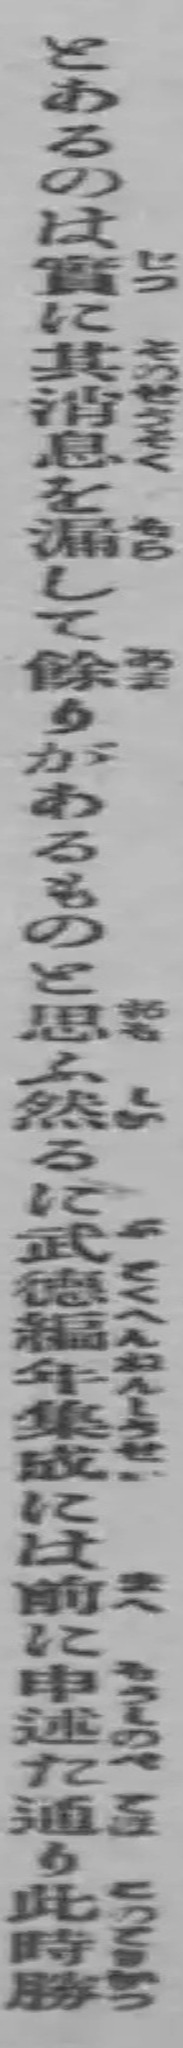とあるのは実に其消息を漏して余りがあるものと思ふ然るに武徳編年集成には前に申述た通り此時勝
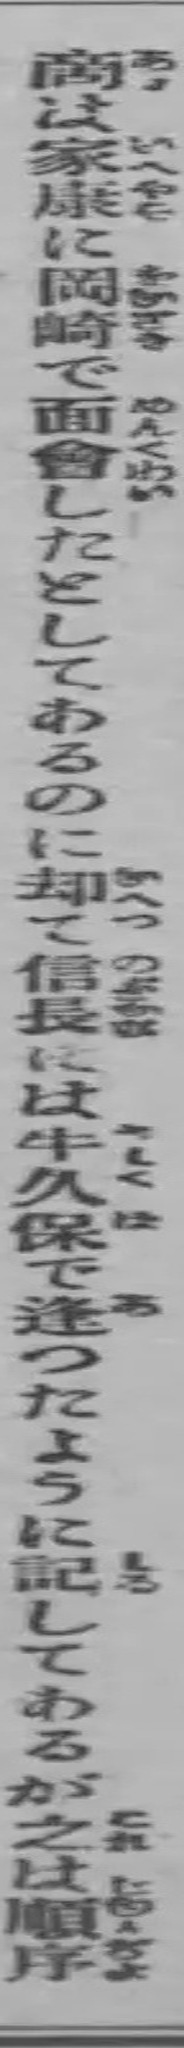商は家康に岡崎で面会したとしてあるのに却て信長には牛久保で逢つたように記してあるが之は順序
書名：豊橋市史談
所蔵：国立国会図書館 National Diet Library, JAPAN
